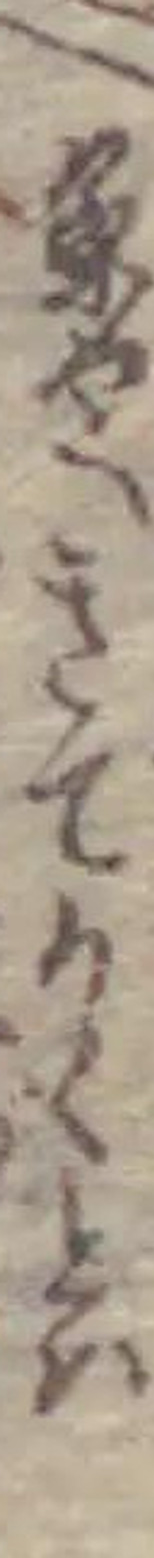東やへきてかくとは
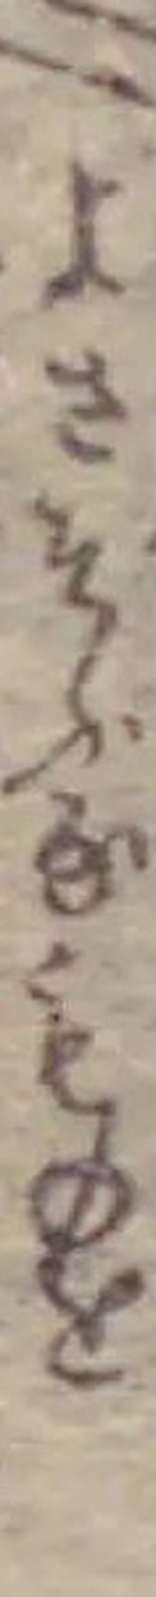よさそふなものを
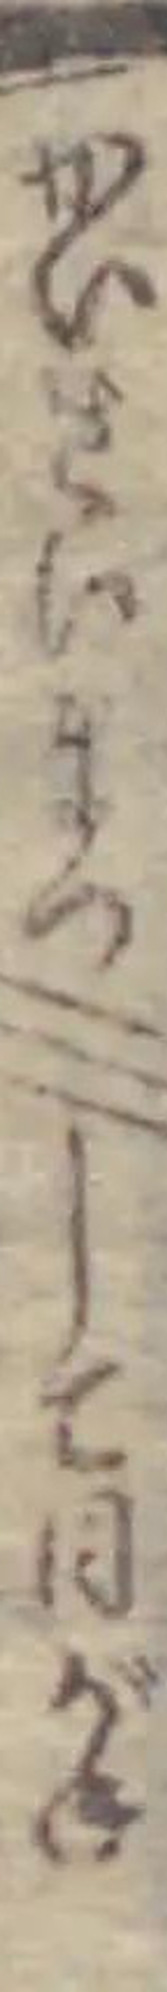かいさいまつして目がね
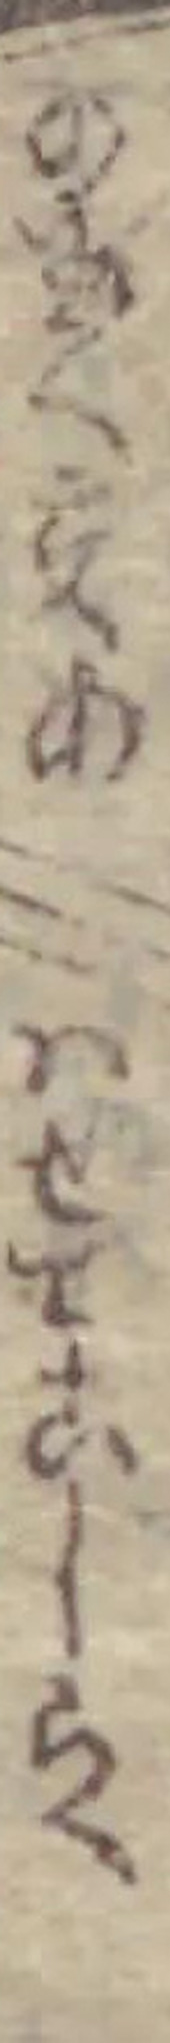の玉へ交あはせてこしらへ
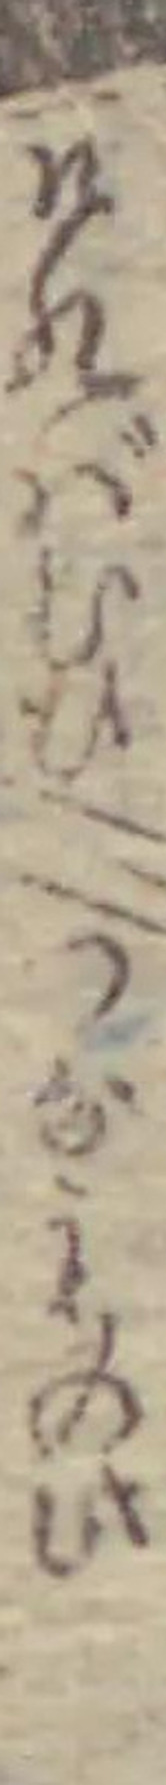ければむひつなもの此
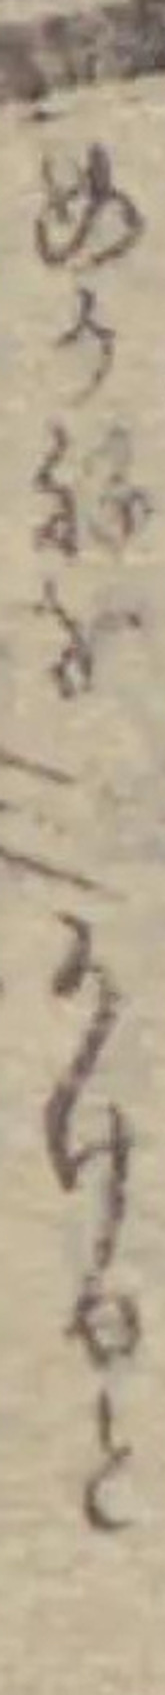めかねをかけると
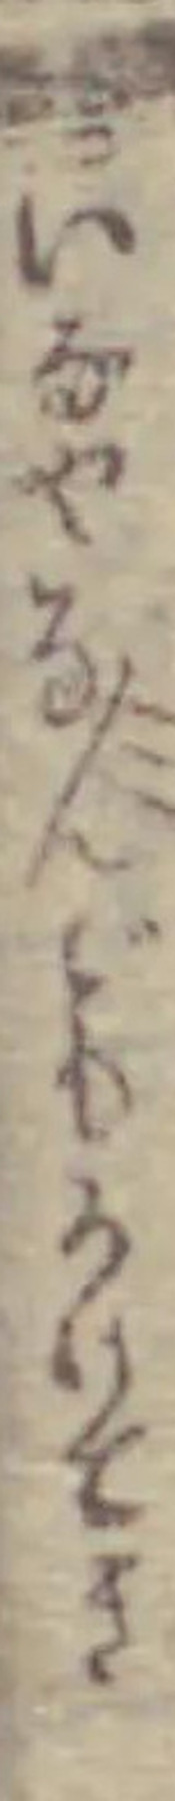いなやなんでもかけてき
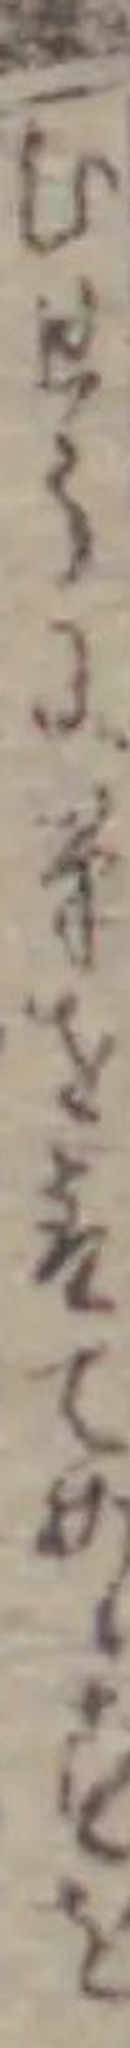むせうに筆を取てめゝずを
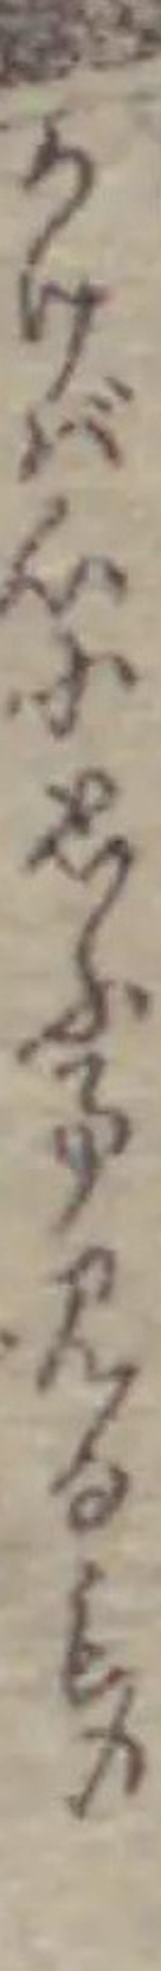かけば心に思ふ事見るもの
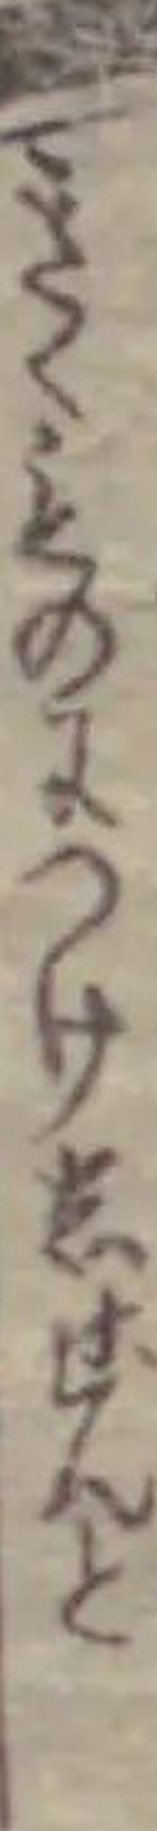きくものにつけしぜんと
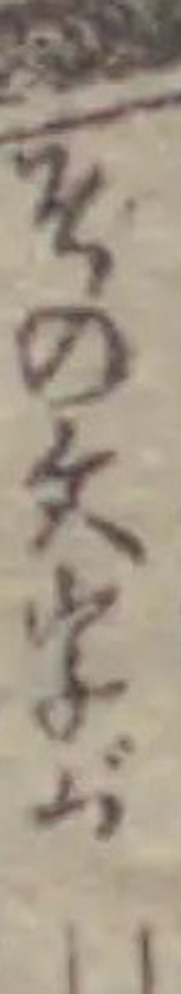その文字が
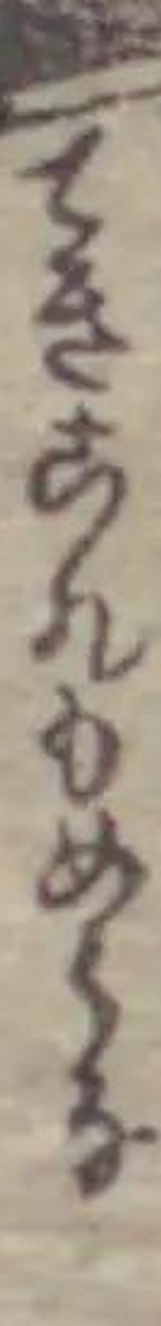てきこれもめうな
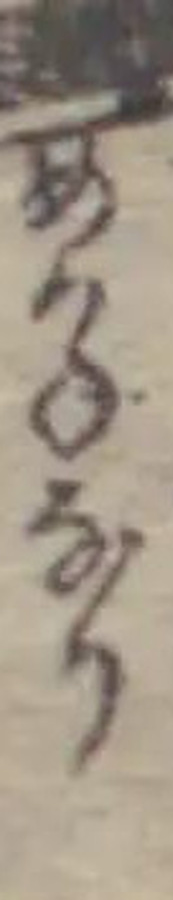めかねなり

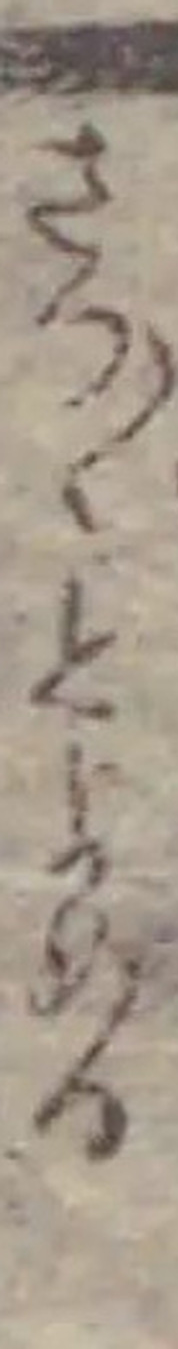さつ〳〵とよめる
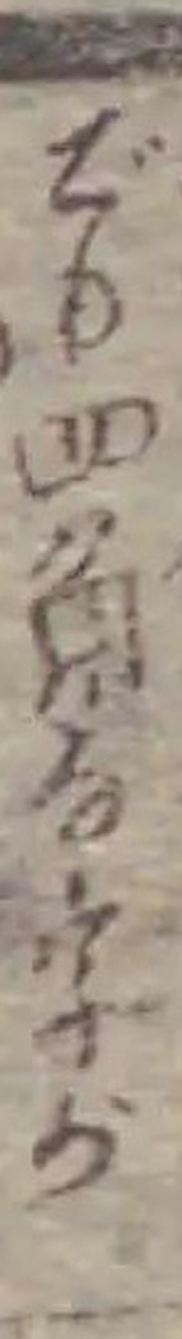でも四角な字が
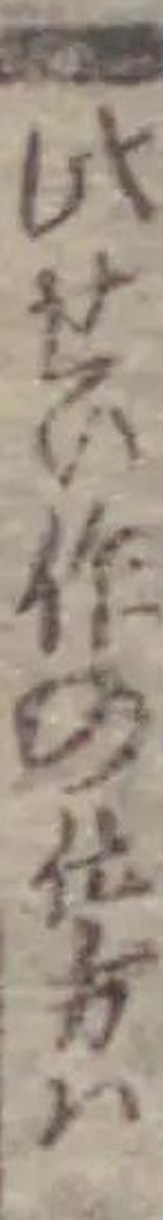此せい作の仕方は
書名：栄増眼鏡徳 3巻
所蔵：国立国会図書館 National Diet Library, JAPAN
